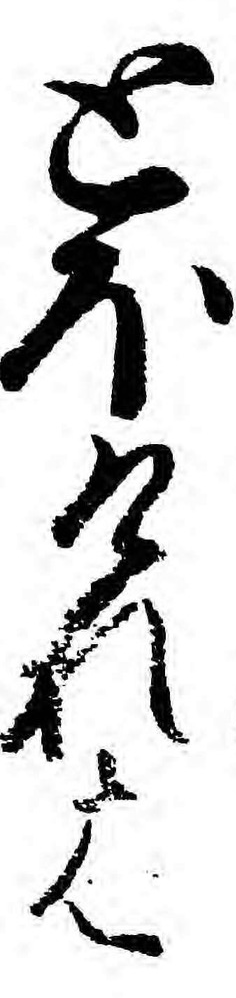とほけれは
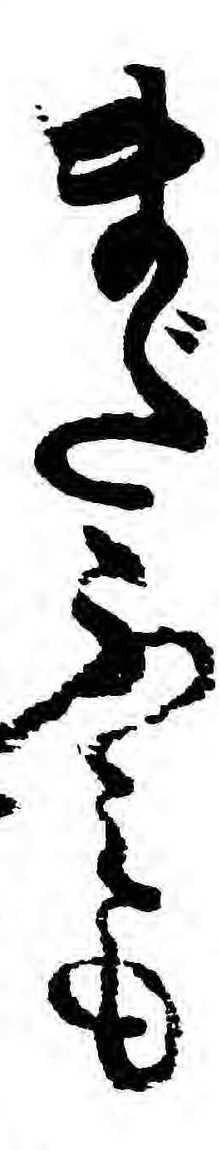まだふみも
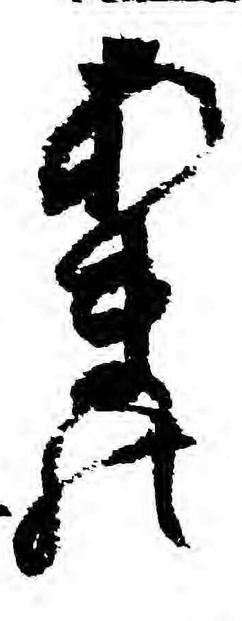あまの
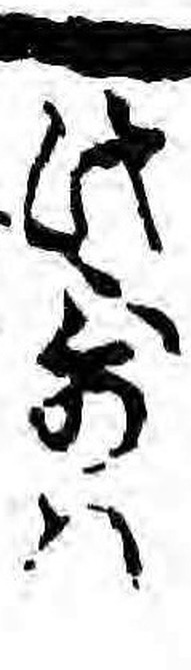此哥は
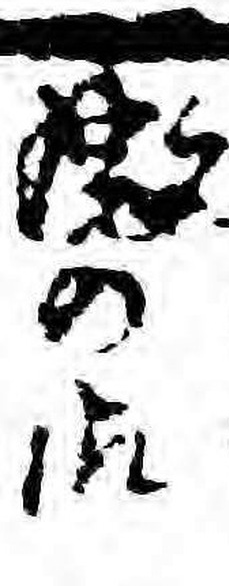院の御
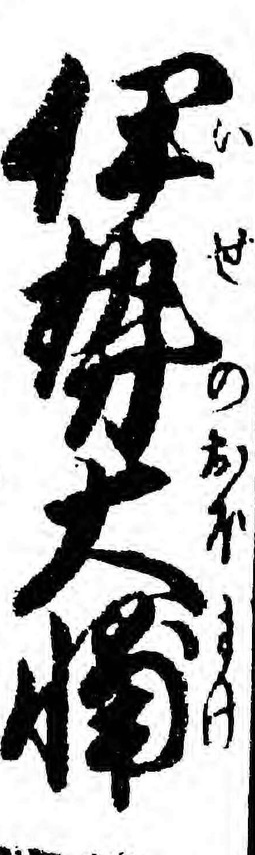伊勢大輔
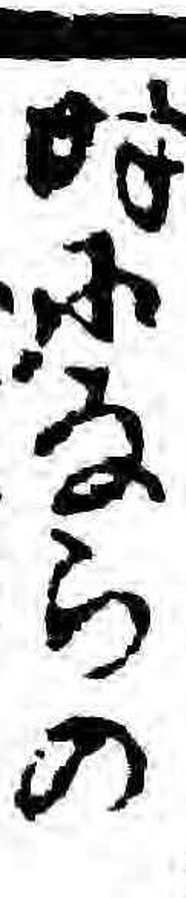時にならの
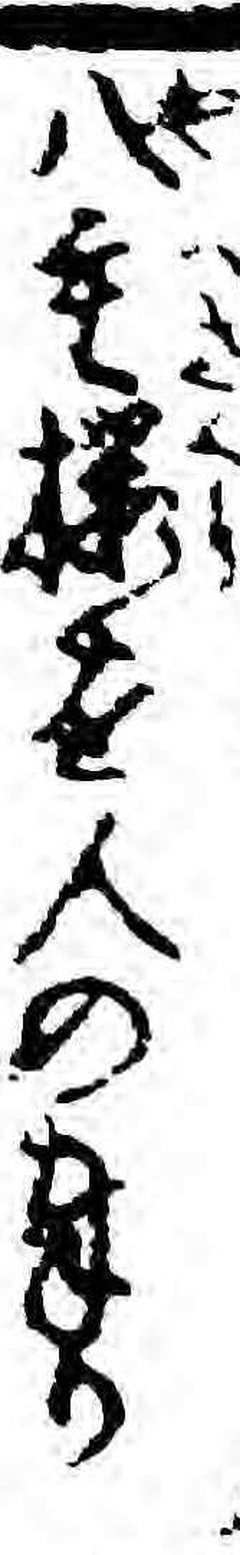八重桜を人の来り
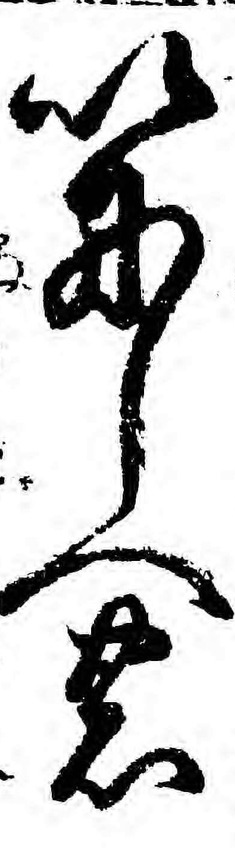いにしへの
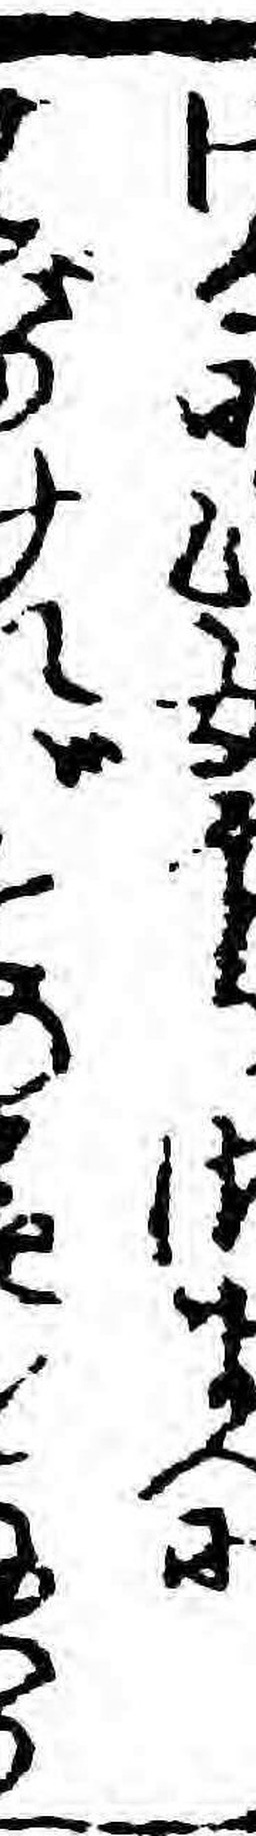はべりければその花を給はり
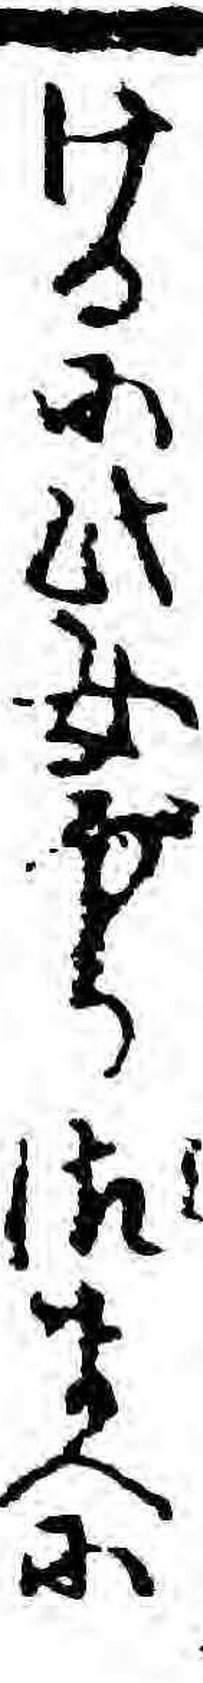けるに此女ぼう御まへに
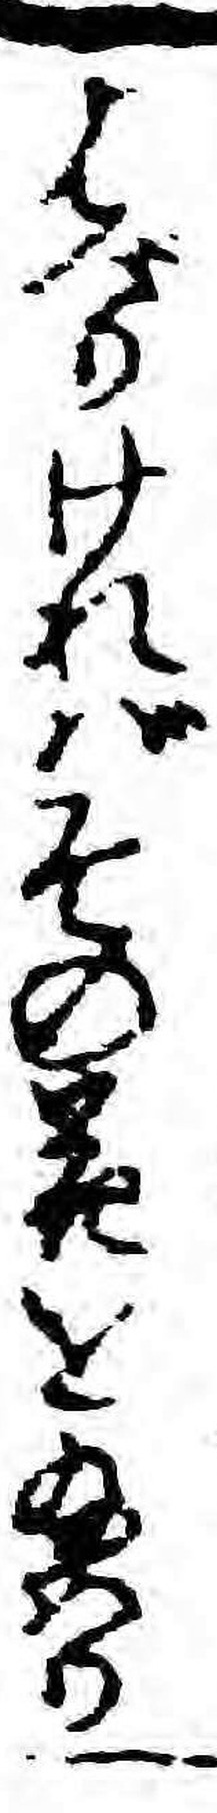はべりければその花を給はり
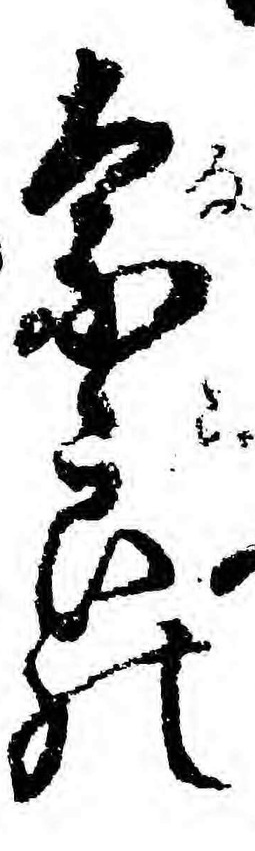奈良の
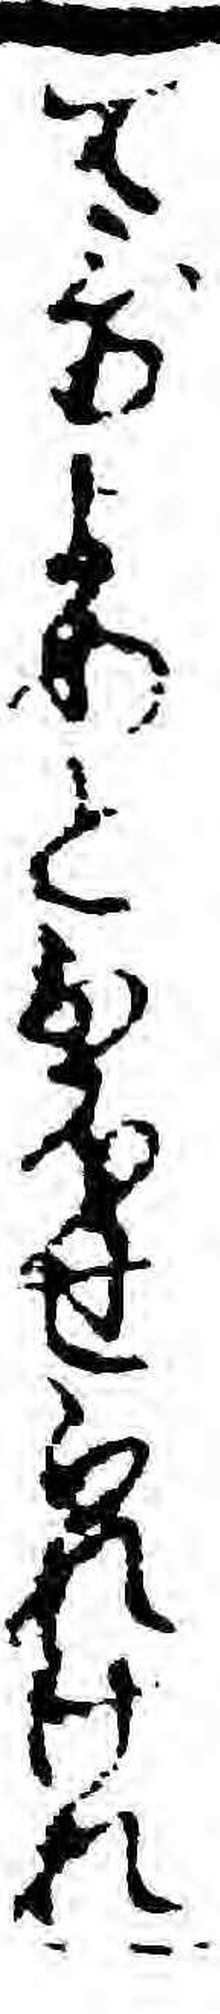て哥よめとおほせられけれ
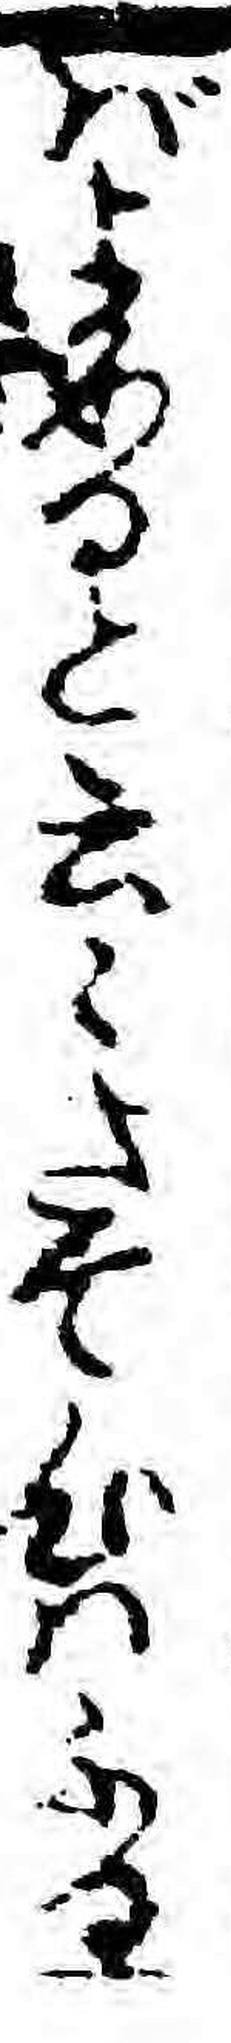ばよめると云々さて心はふる
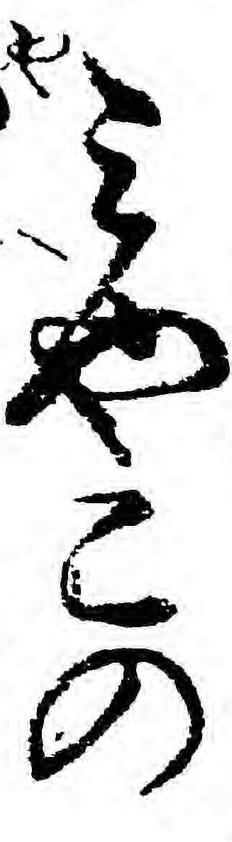みやこの
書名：頭書和歌注譯／壽賀多百人一首小倉錦
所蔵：国文学研究資料館
